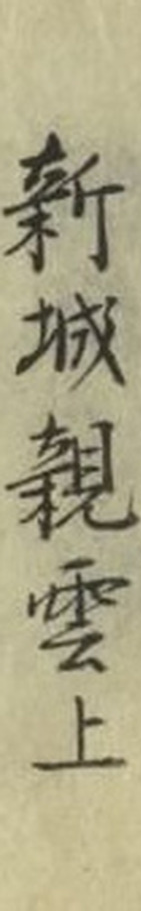新城親雲上
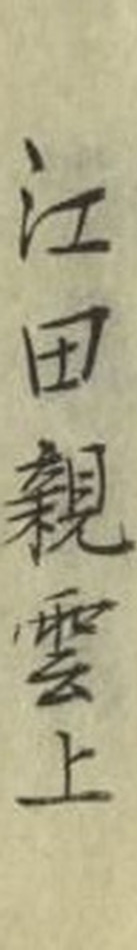江田親雲上
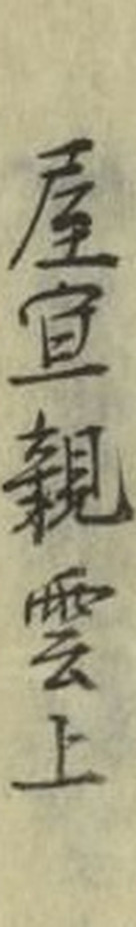屋宜親雲上
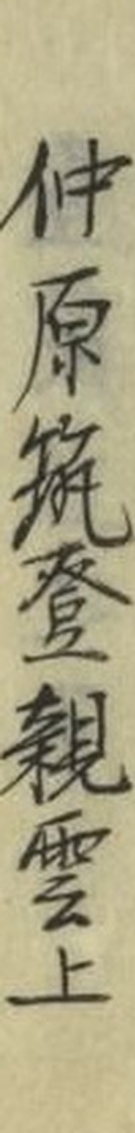仲原筑登親雲上
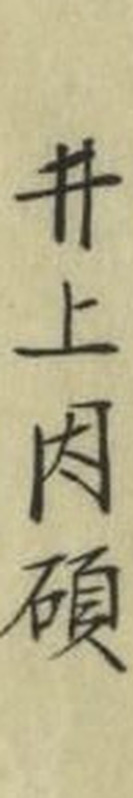井上因硯
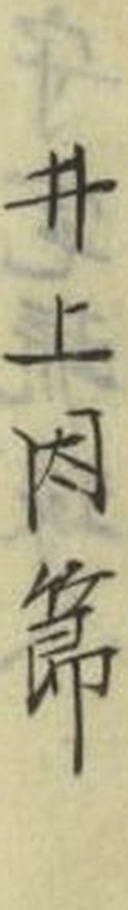井上因節
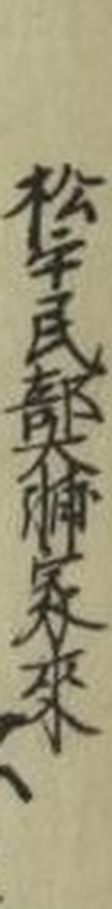松平民部大輔家来
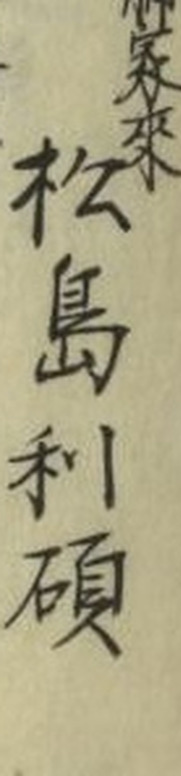松島利硯
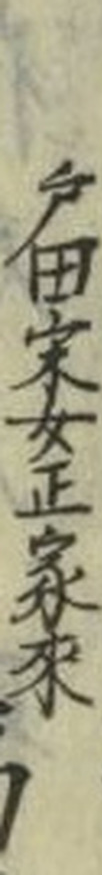戸田采女正家来
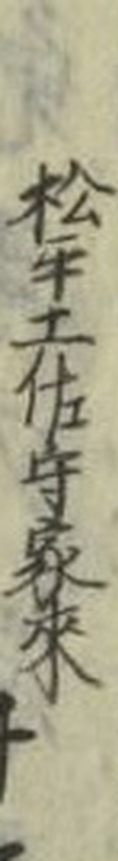松平土佐守家来
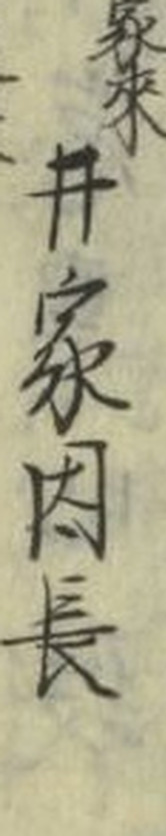井家因長
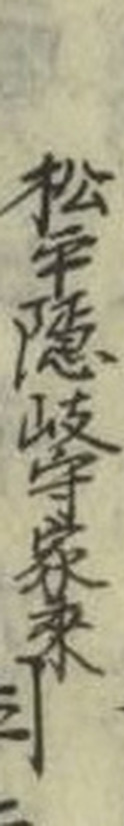松平隠岐守家来
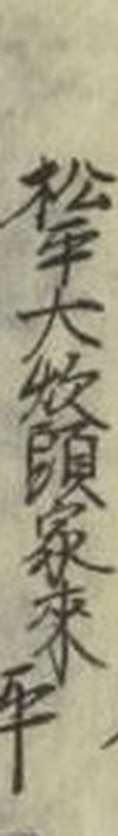松平大炊頭家来
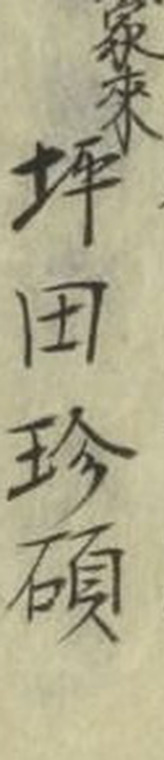坪田珍硯

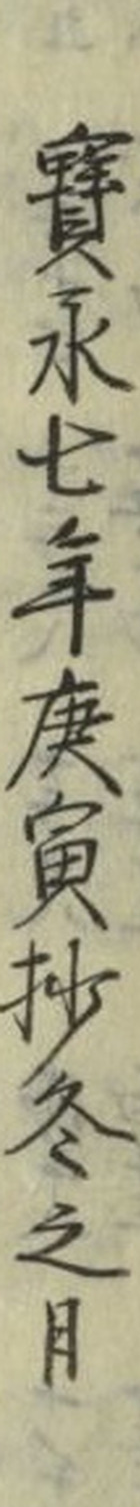宝永七年庚寅抄冬之月
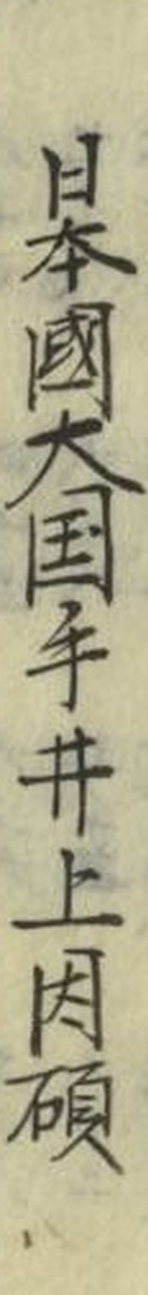日本国大国手井上因硯
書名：宝永七庚寅年琉球国来聘使日記
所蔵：University of the Ryukyus Library
